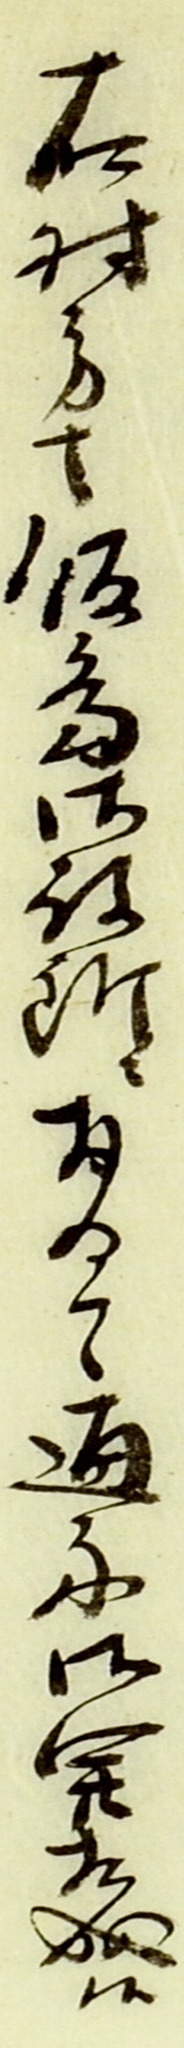右村方は飯島御役所ニおゐて通舟御開相成候
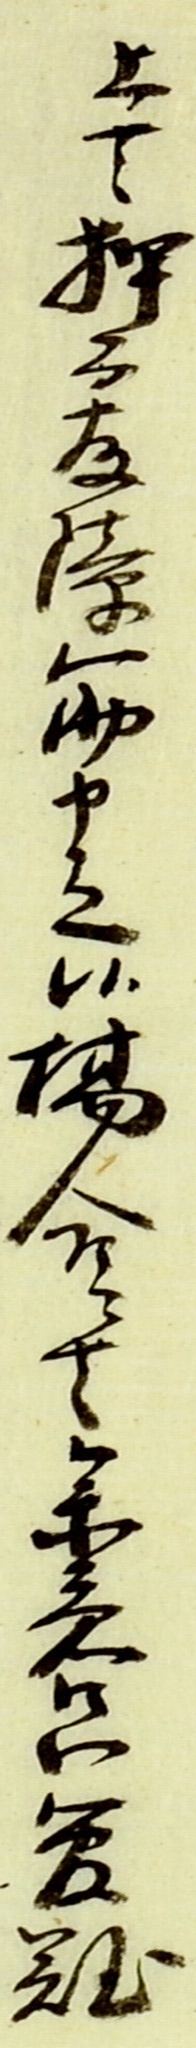上て押而故障筋申立候場合ニは参意只管難
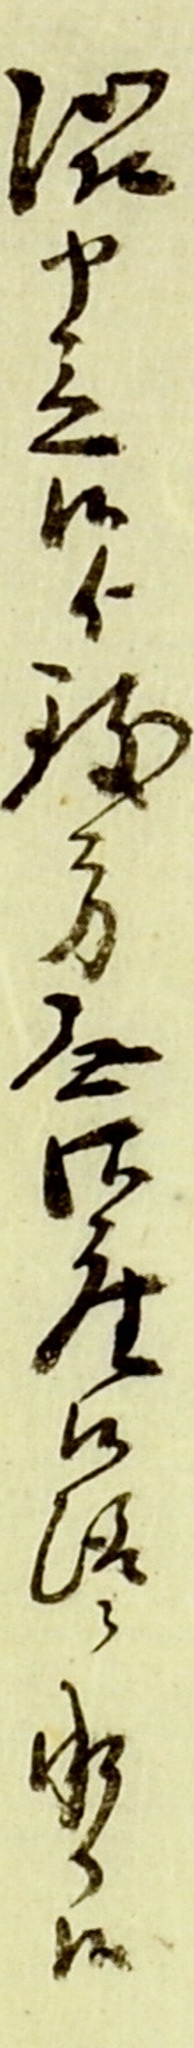渋申立候ゟ致方無御座候趣ニ承り候
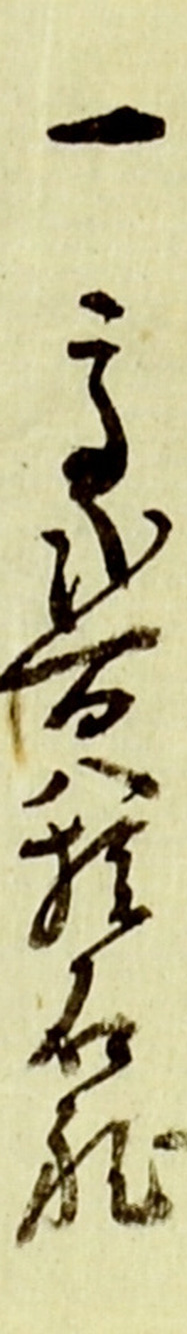一高弐百八拾石程
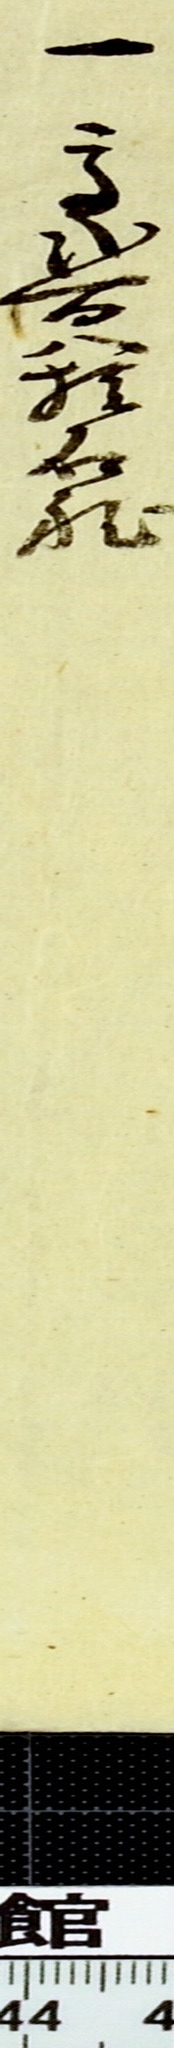一高弐百八拾石程
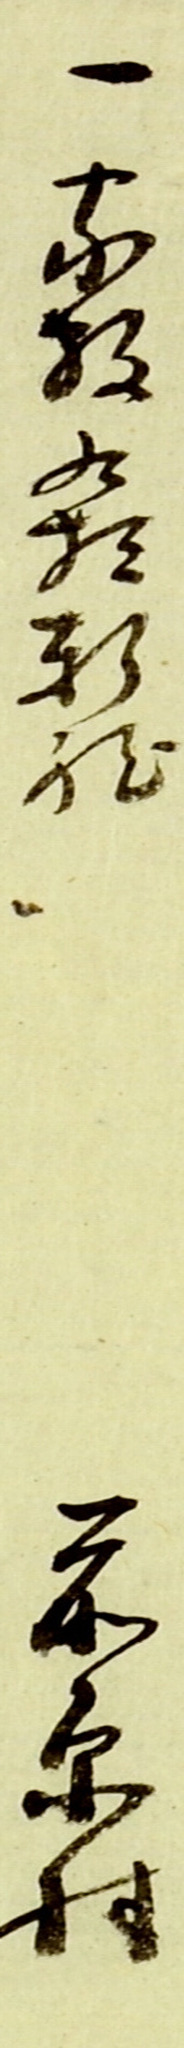一家数九拾軒程前原村
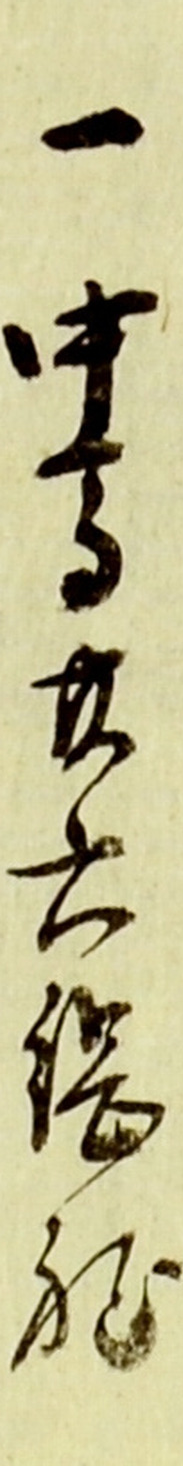一中馬拾六綱程
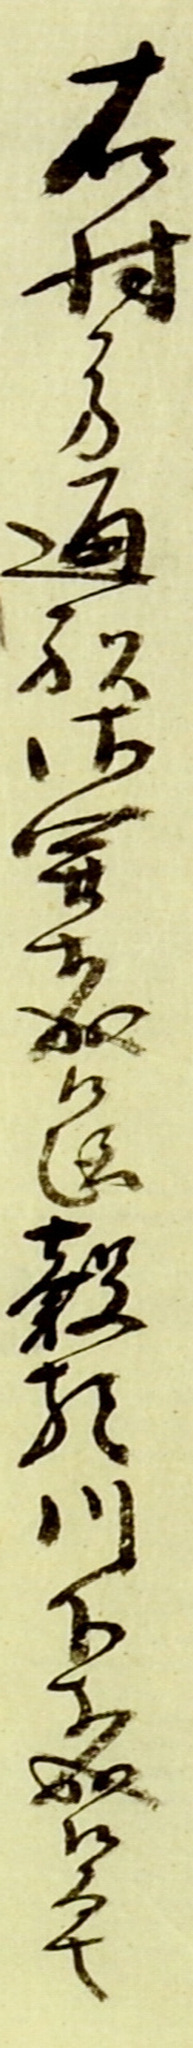右村方通船御開相成候趣穀類川下相成候而は
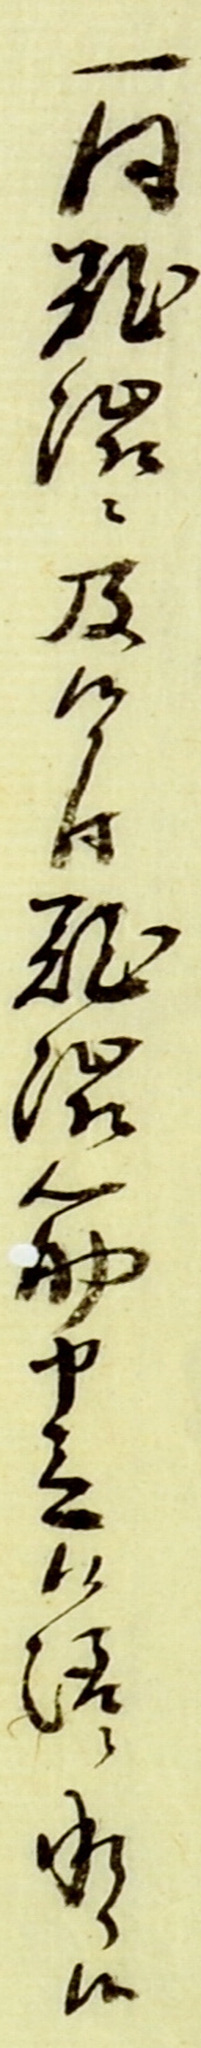一同難渋ニ及候ニ付難渋筋申立候趣ニ承り候

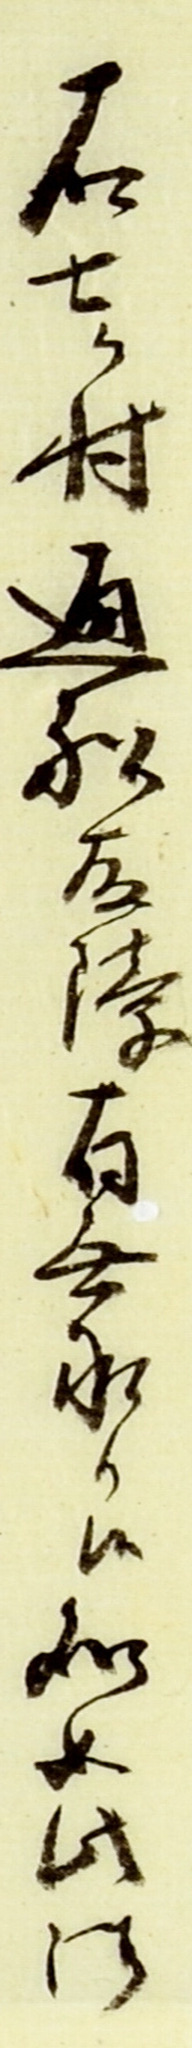右七ヶ村通船故障有無承り候処如此御
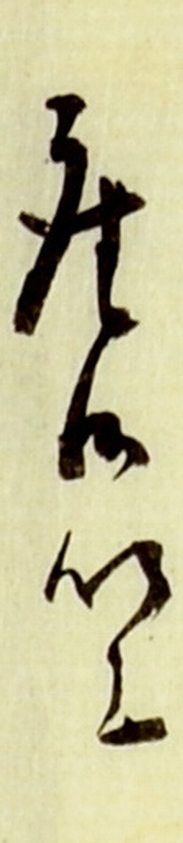座候以上
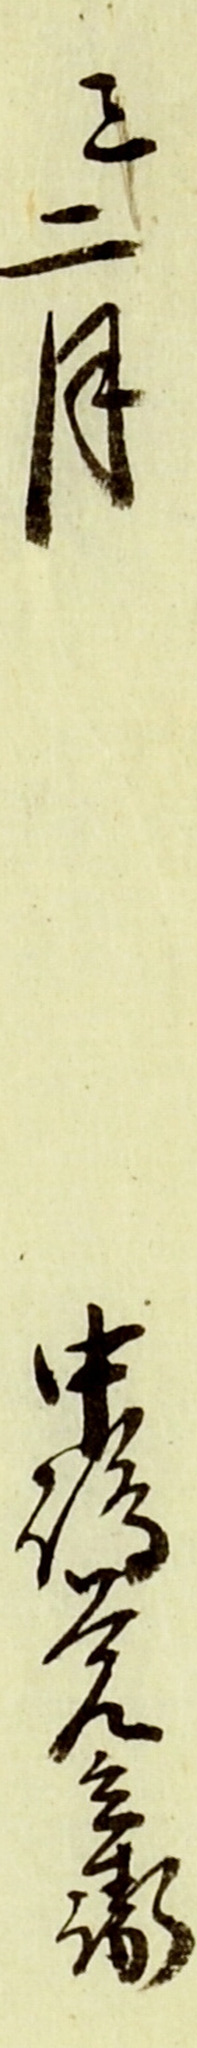巳二月中嶋覚兵衛
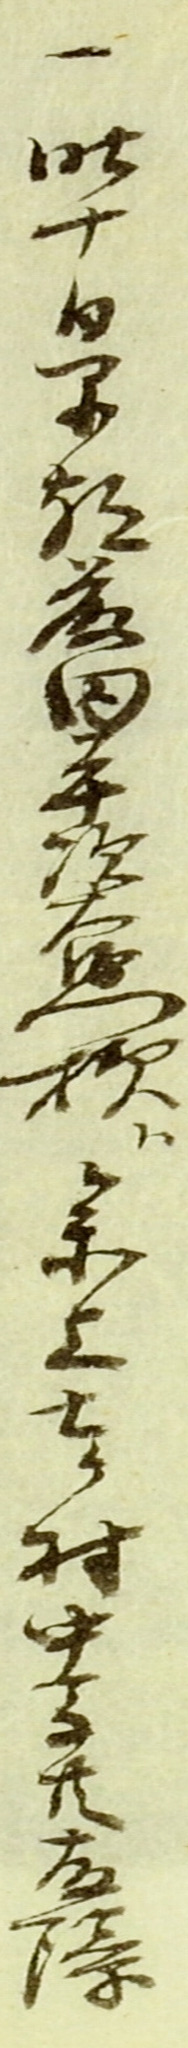一昨十日早朝藤田平次右衛門様ハ参上七ヶ村中馬共故障
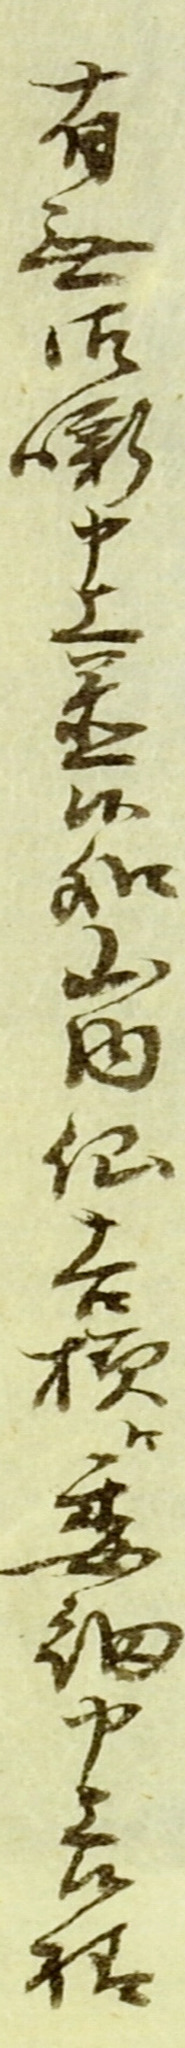有無御噺申上置候処山内仙吉様江委細申上候様
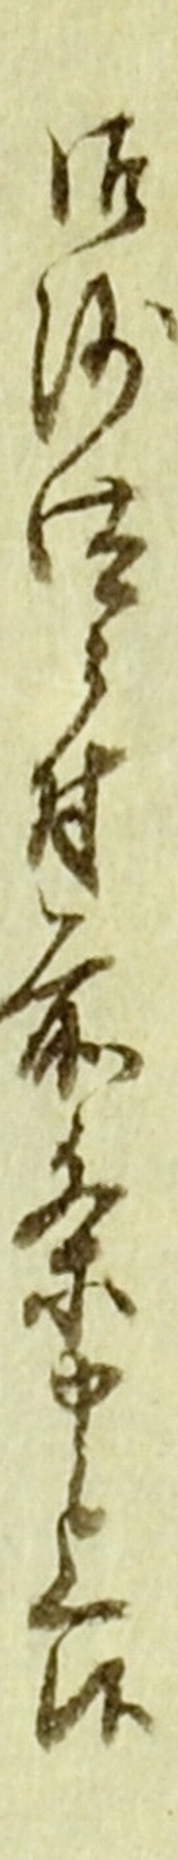御沙汰ニ付前条申上候
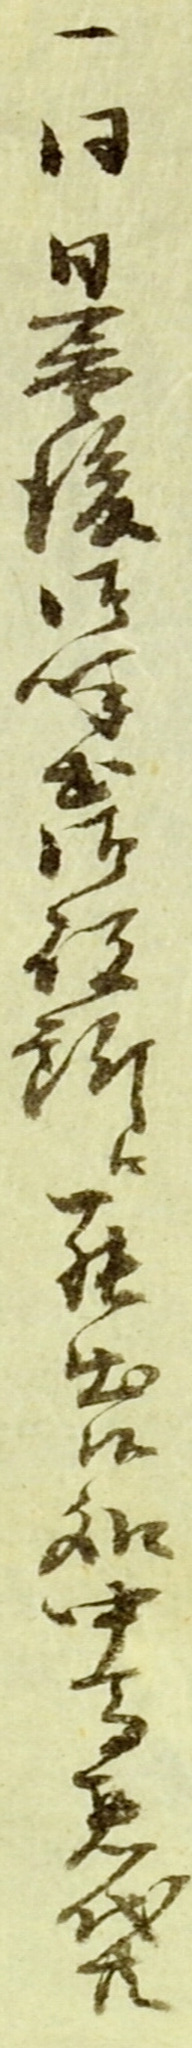一同日常後御呼出御役所江罷出候処中馬惣代共
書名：調査報告書
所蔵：伊那市立高遠町図書館・合同会社AMANE
